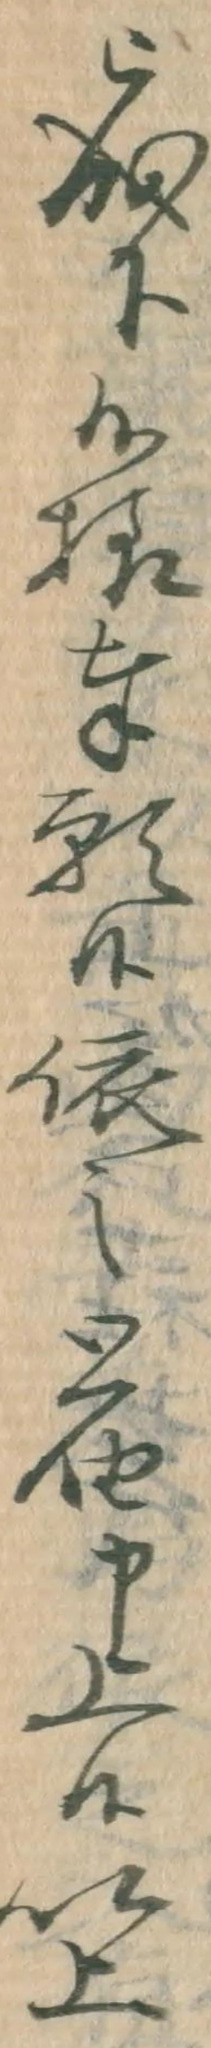被成下候様奉願候依之御届申上候以上

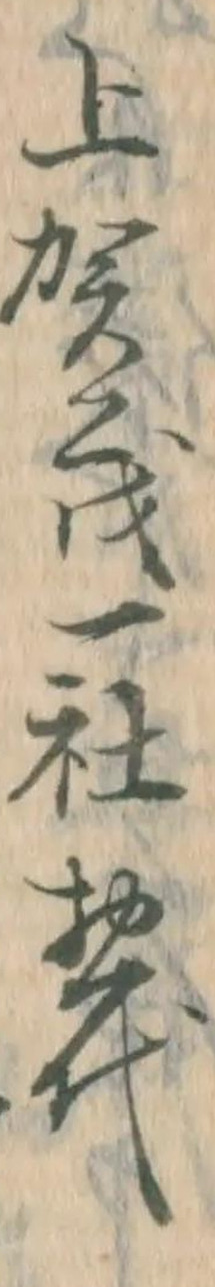上賀茂一社惣代
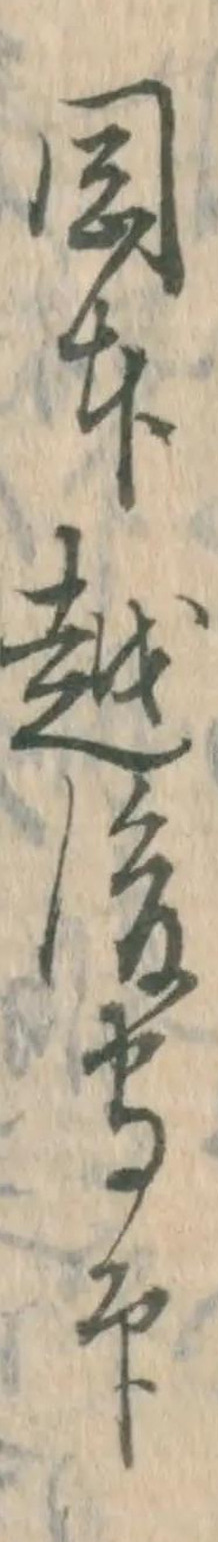岡本越後守印
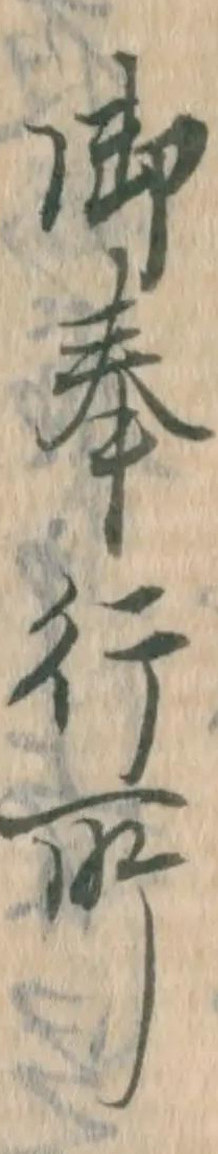御奉行所
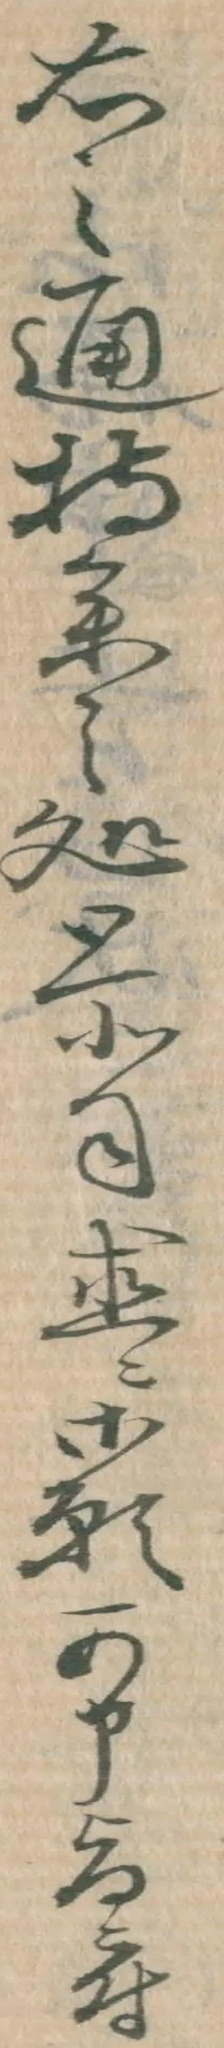右之通持参之処御所司へ直ニ御願可申旨ニ付
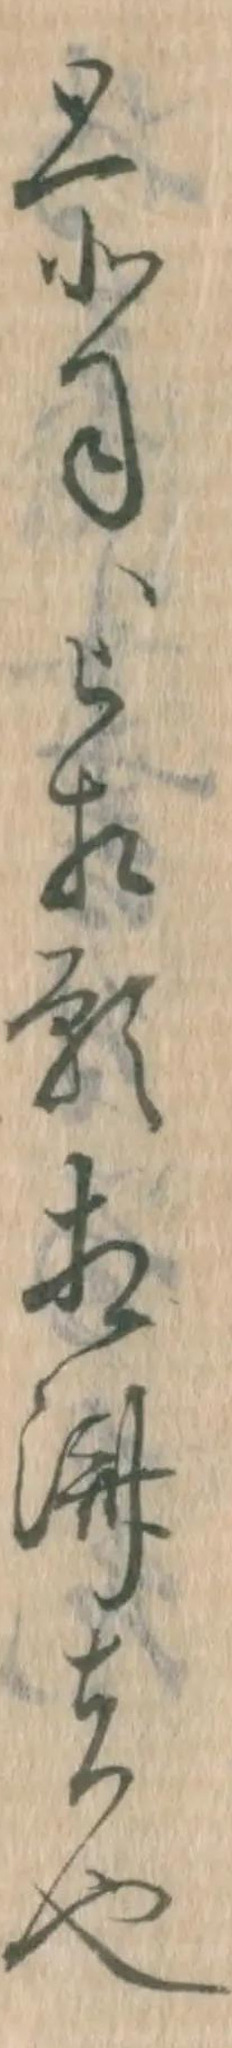御所司へ被相願相済者也
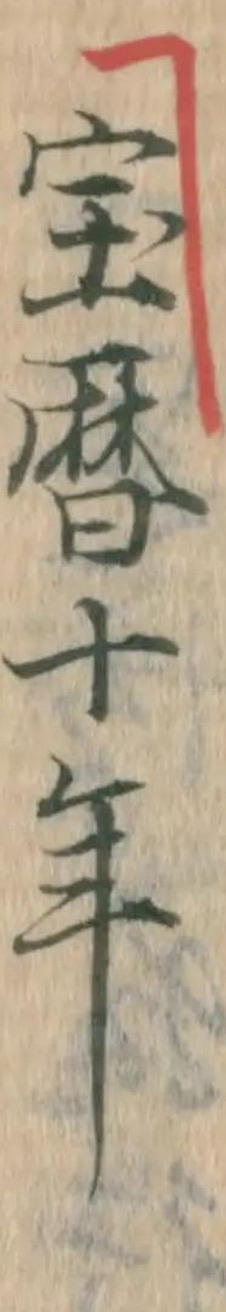宝暦十年
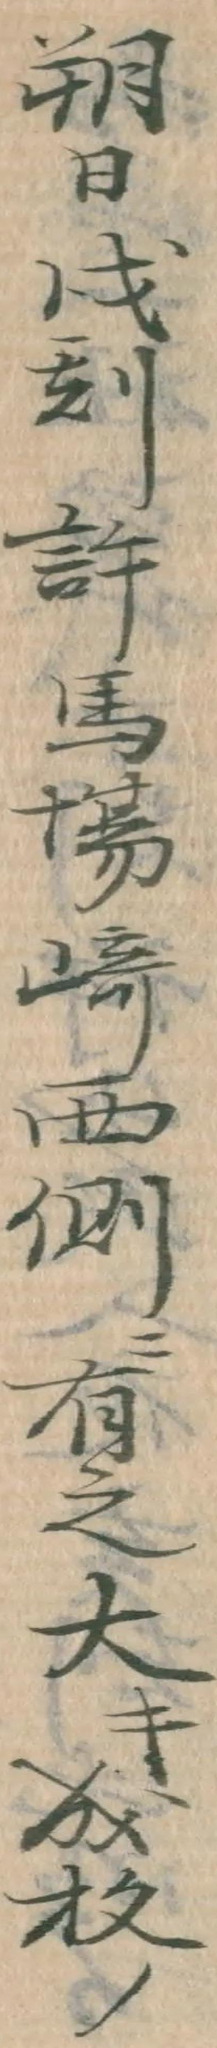朔日戌刻許馬場崎西側ニ有之大キ成杦ノ
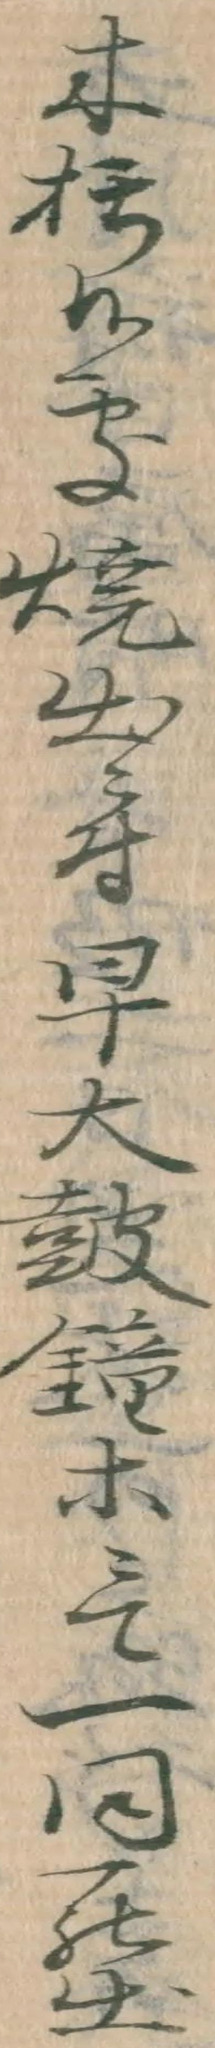木朽候処焼出ニ付早大鼓鐘等ニて一同罷出
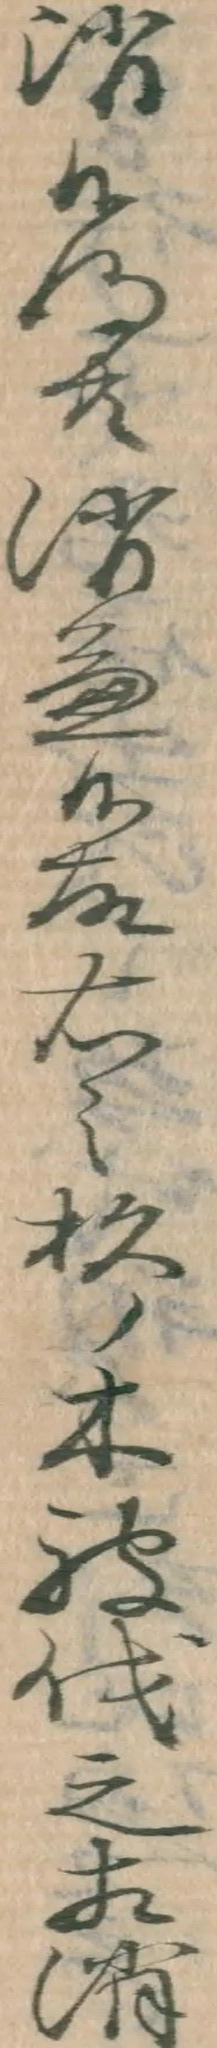消候得共消兼候故右之杦ノ木被伐之相消
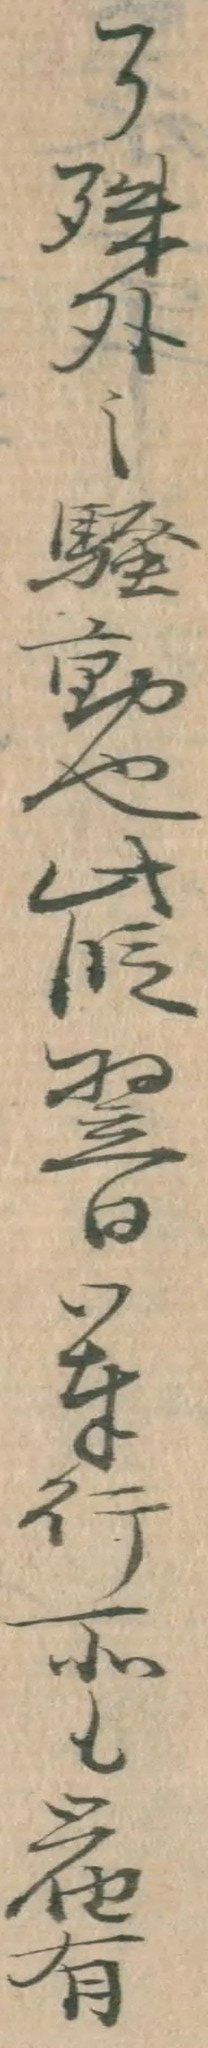了殊外之騒動也此段翌日御奉行所も御届有
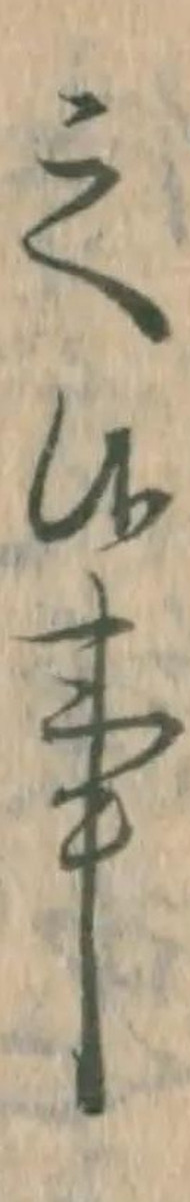之候事
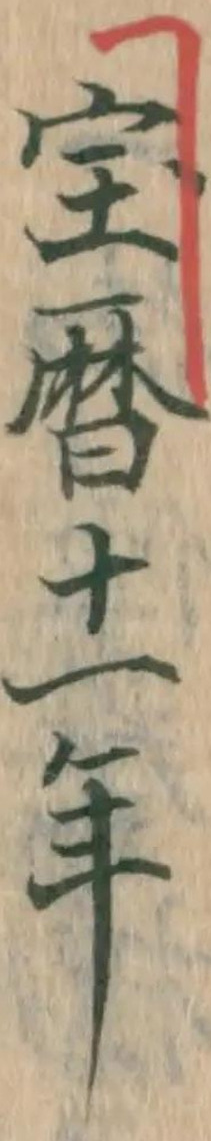宝暦十一年
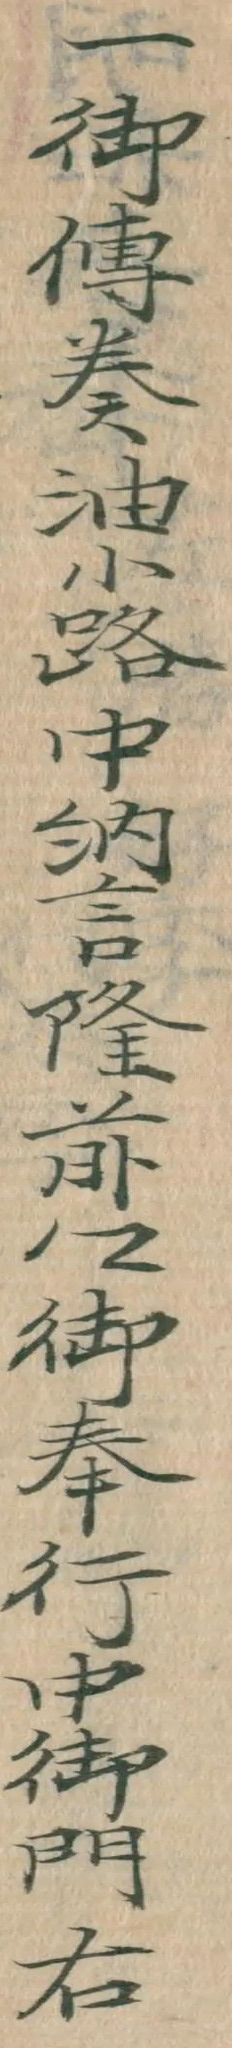一御伝奏油小路中納言隆前卿御奉行中御門右
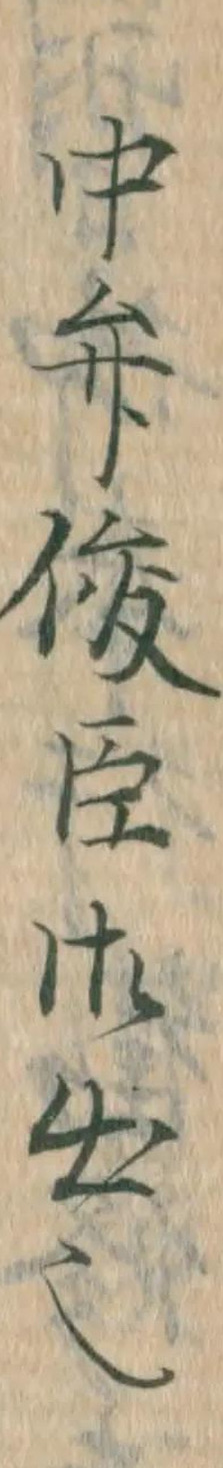中弁俊臣御出也
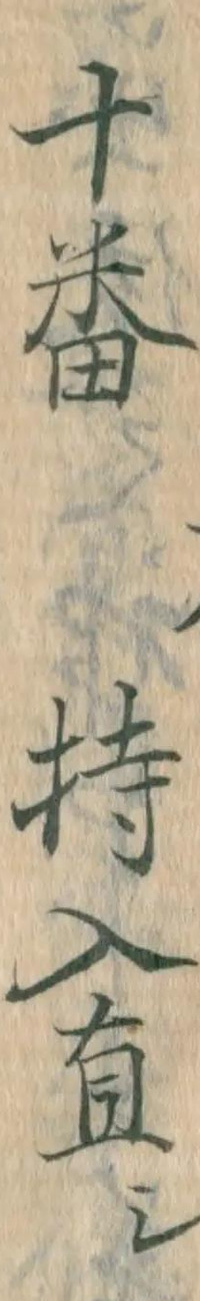十番持入直シ
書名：賀茂社記録. 第10冊
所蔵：国立国会図書館 National Diet Library, JAPAN
